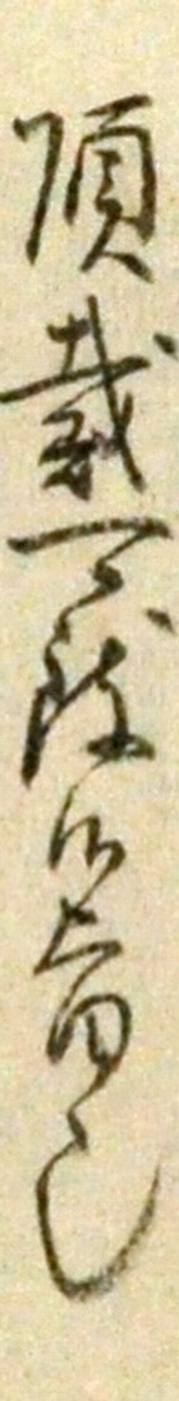頂戴可致候旨也
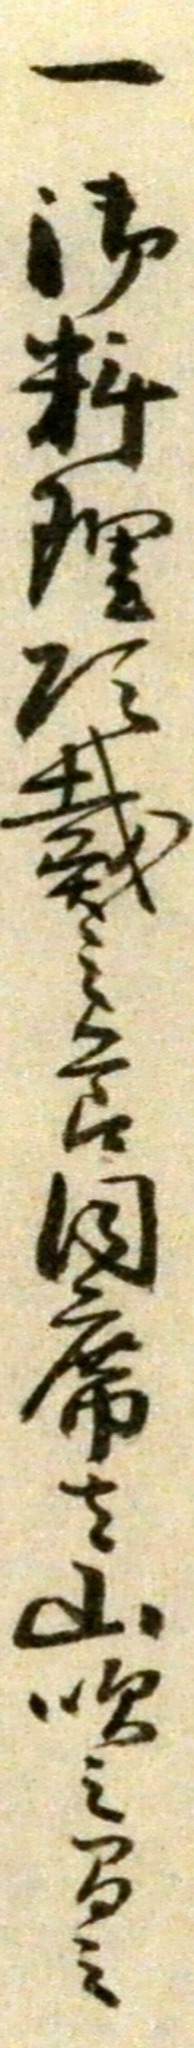一御料理頂戴之節同席は山吹之間之
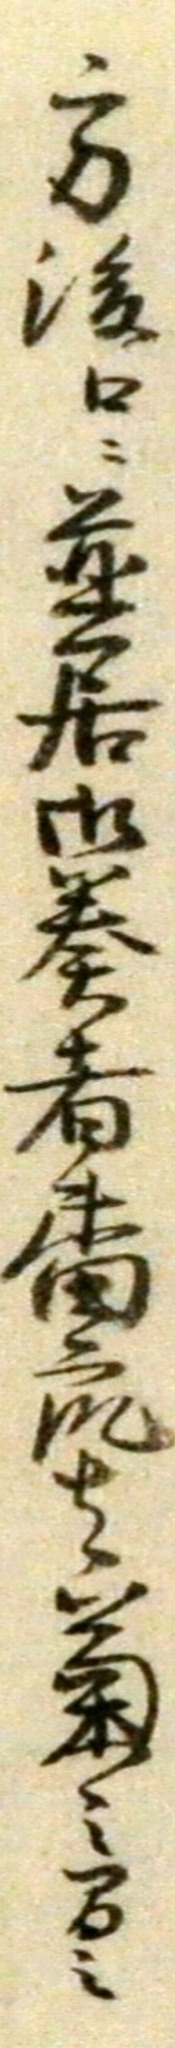方後ロニ並居御奏者番衆は菊之間之
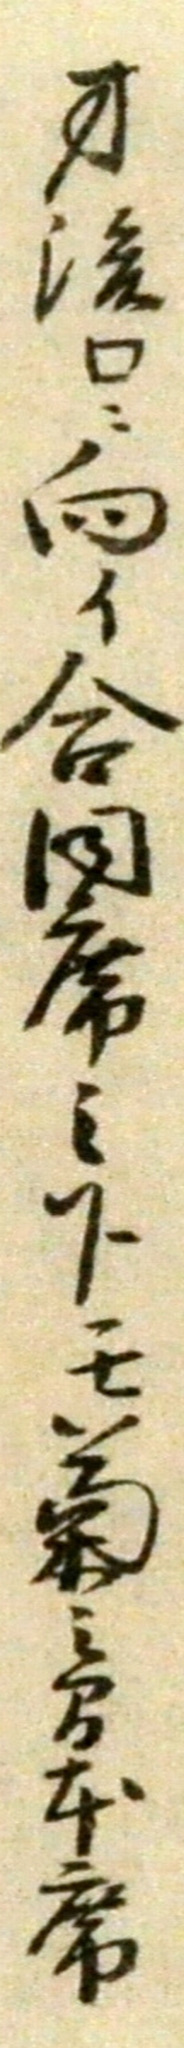方後ロニ向イ合同席之下モ菊之間本席

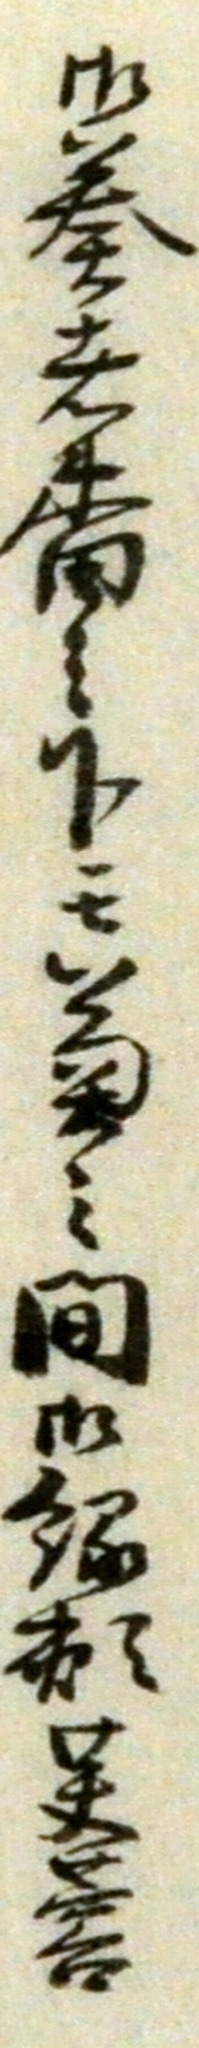御奏者番之下モ菊之間御縁頬芙蓉
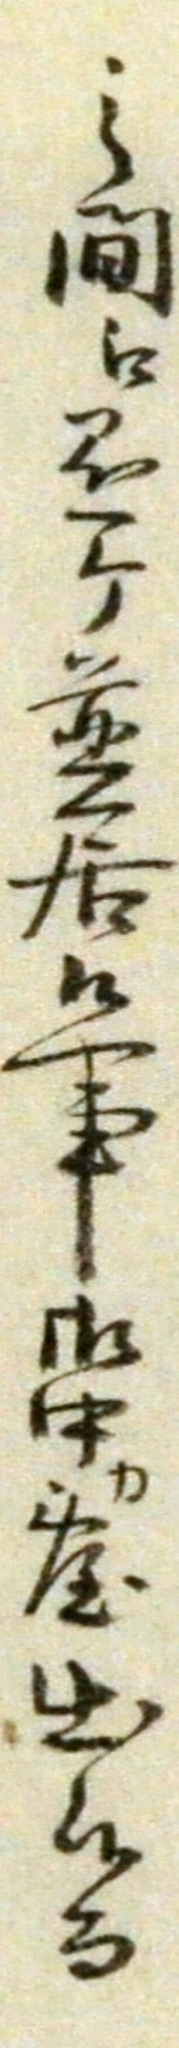之間え懸ケ並居候事御中ヵ臺出候而
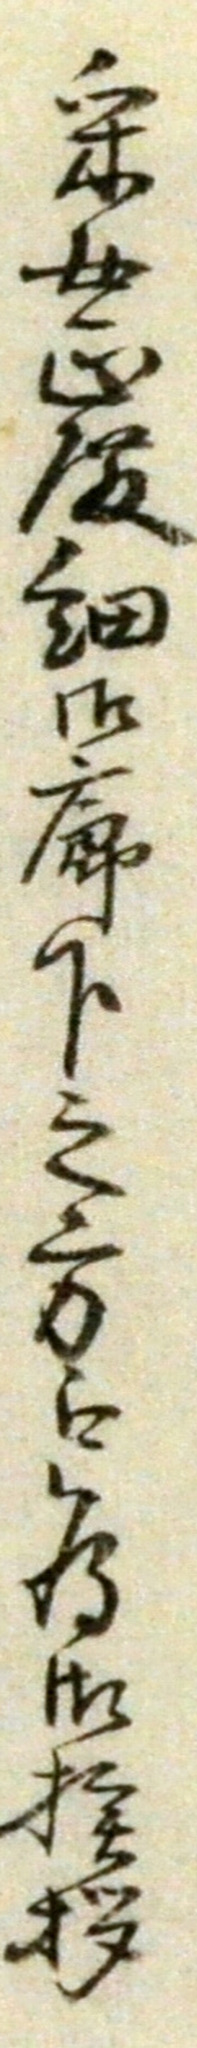采女正殿細御廊下之方え為御挨拶
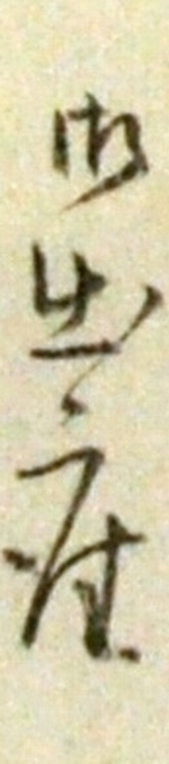御出座
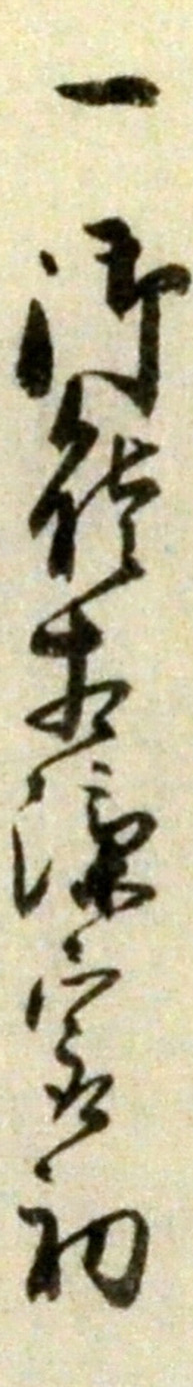一御能相済最初
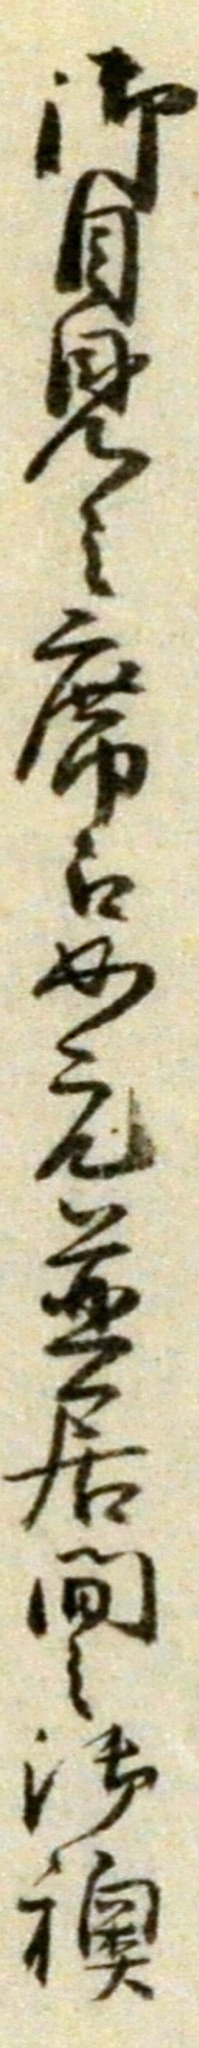御目見之席え如元並居間之御襖
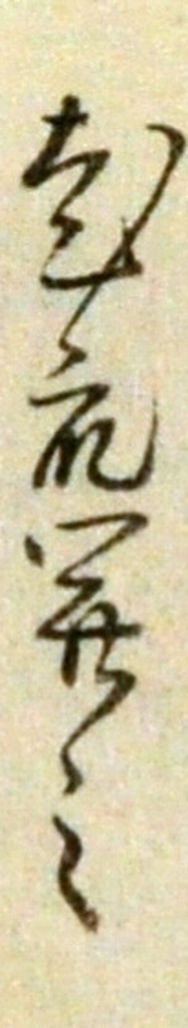老衆開之
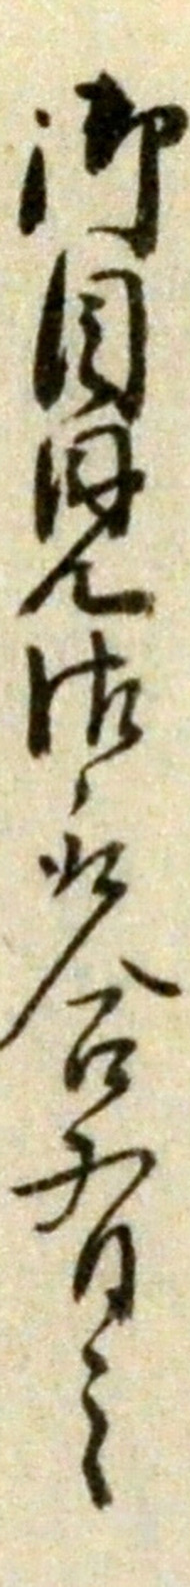御目見御取合有之
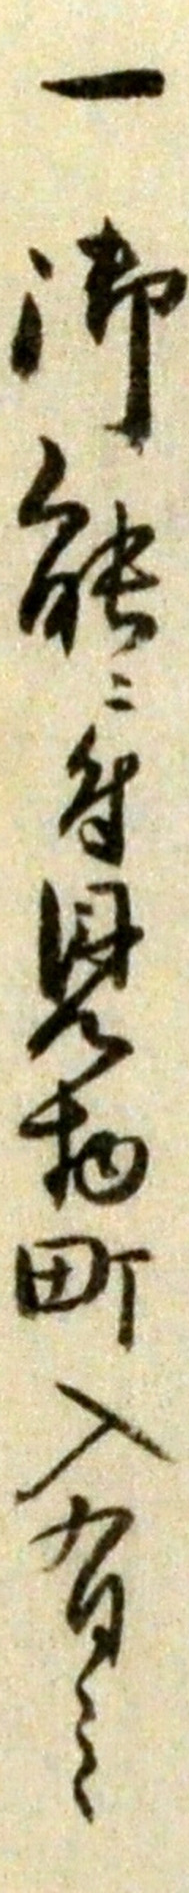一御能ニ付見物町入有之
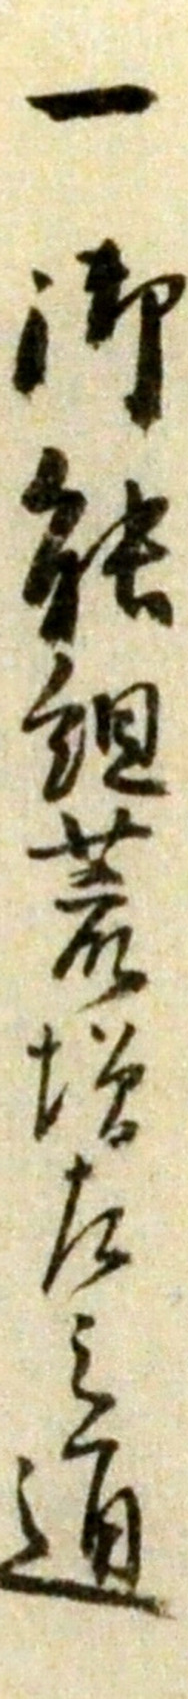一御能組荒増左之通
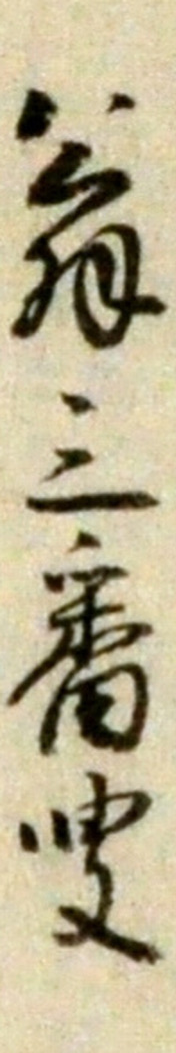翁三番叟
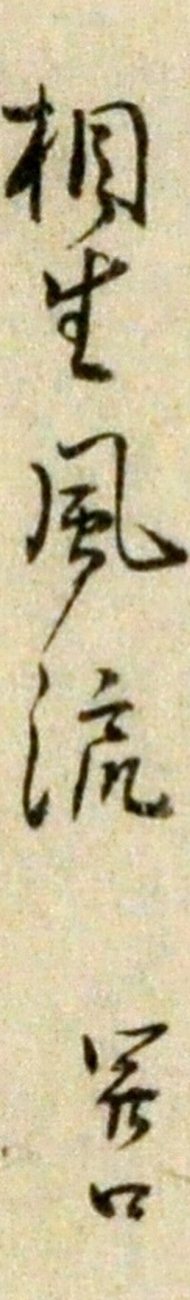相生風流開口
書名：若君様（家斉嫡男）誕生諸祝儀ノ節ノ留書外
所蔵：伊那市立高遠町図書館・合同会社AMANE
